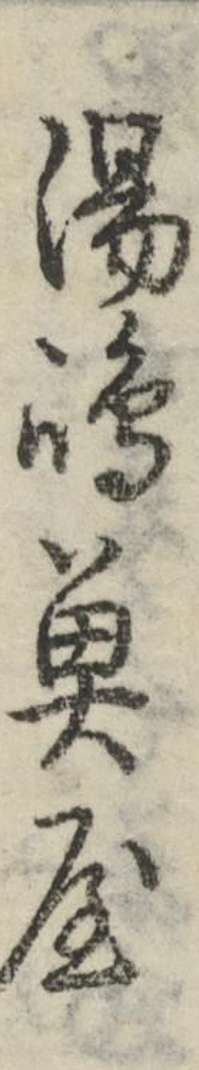湯嶋魚屋
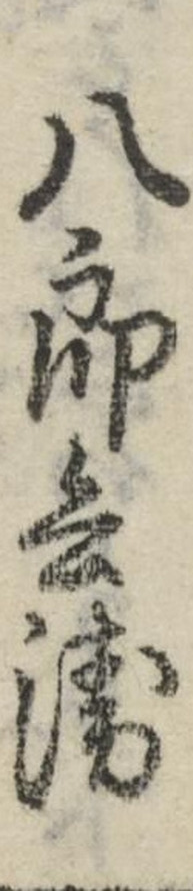八郎兵衛
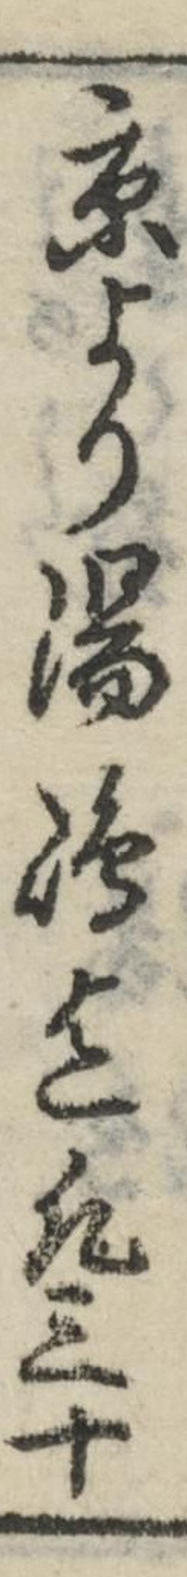京より湯嶋迄凡三十
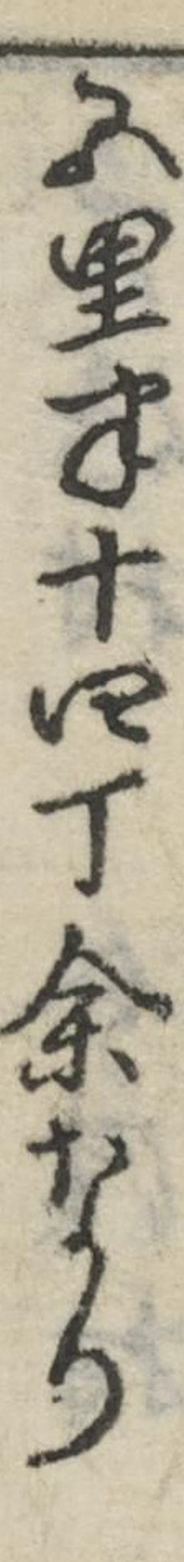五里半十四丁余なり
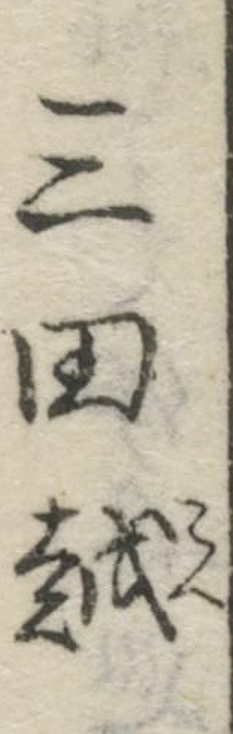三田越
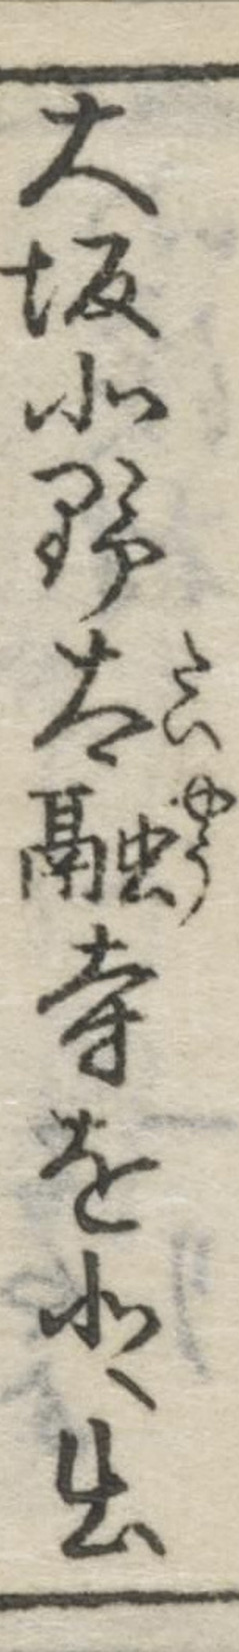大坂北野太融寺を北へ出
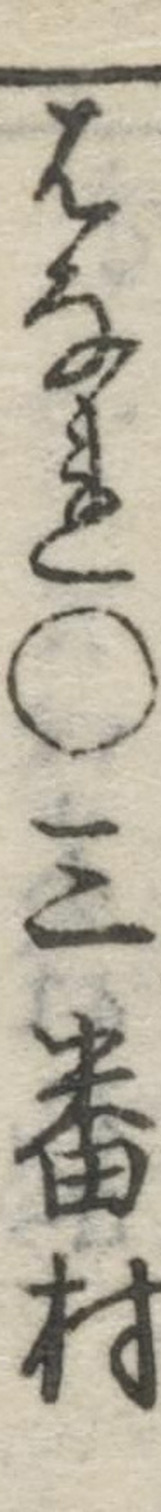はなれ○三番村
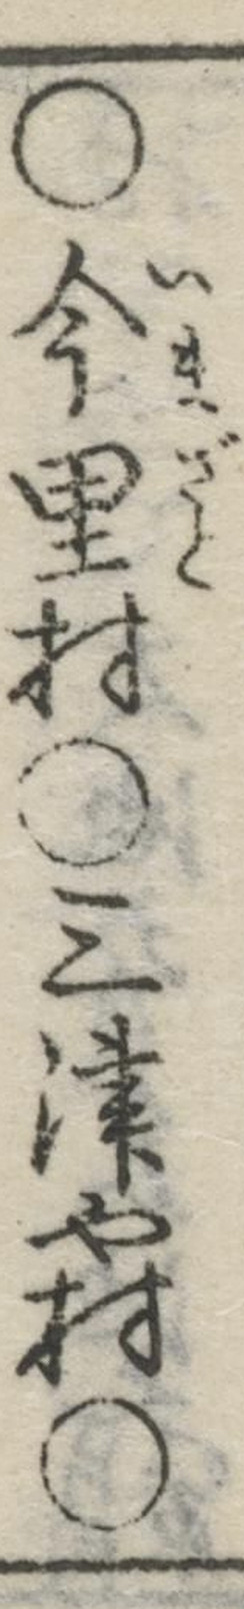○今里村○三津や村○
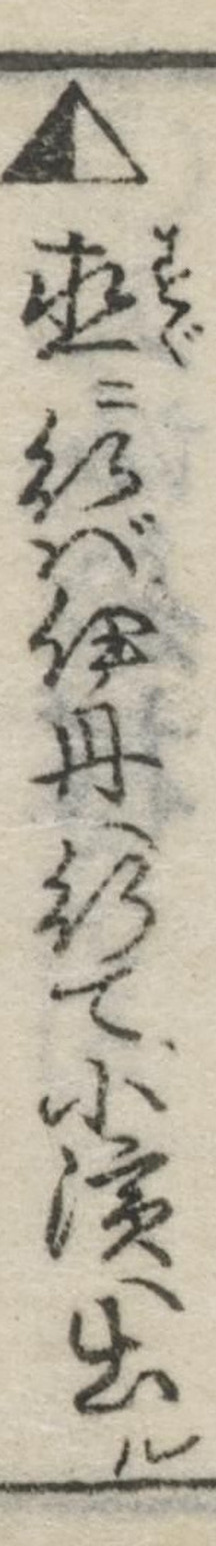▲直に伊丹へ行て小濱へ出る
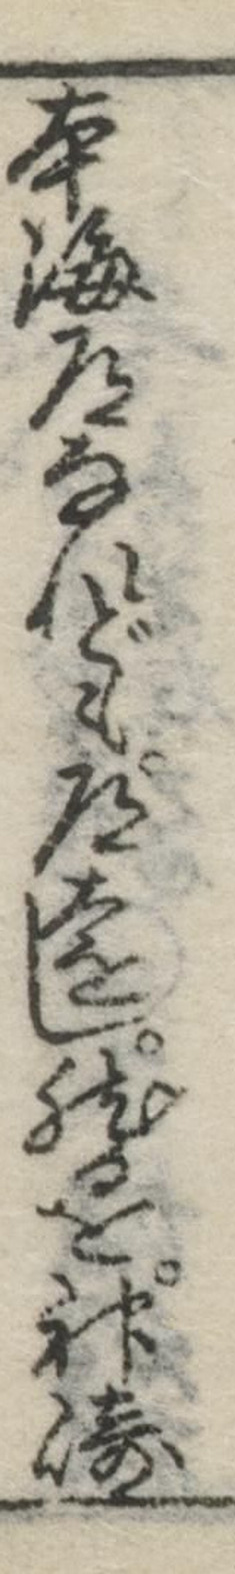本海道なれども。道遠し。然るを。神崎
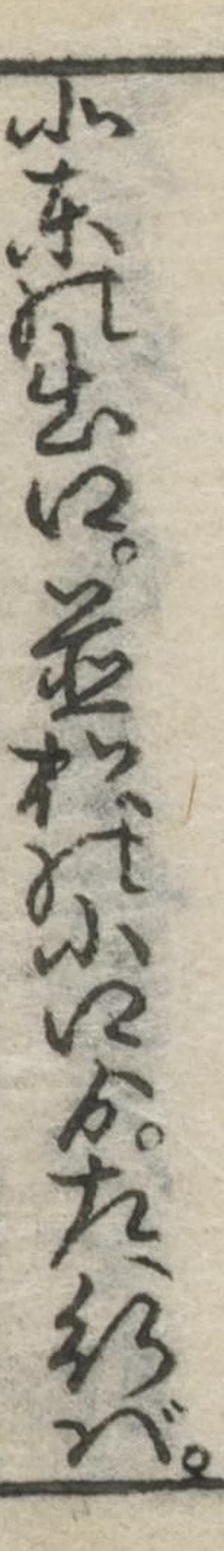北東の出口。並松の小口ゟ。左へ行ば。

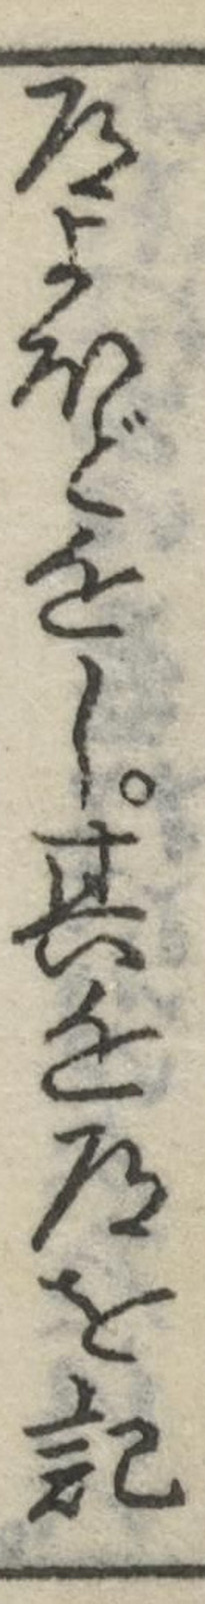道よほど近し。其近道を記
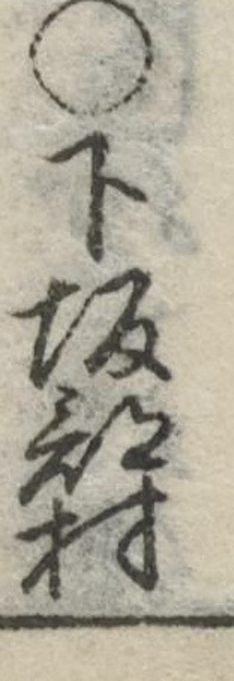○上坂部村
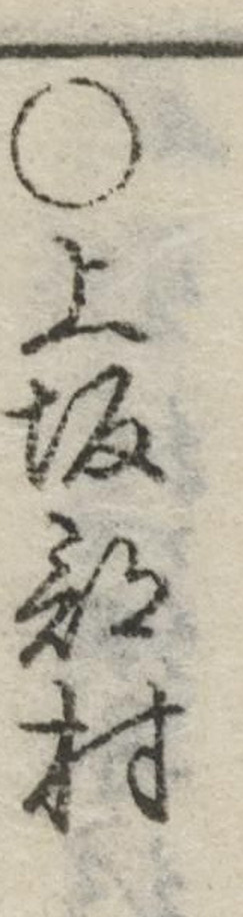○上坂部村
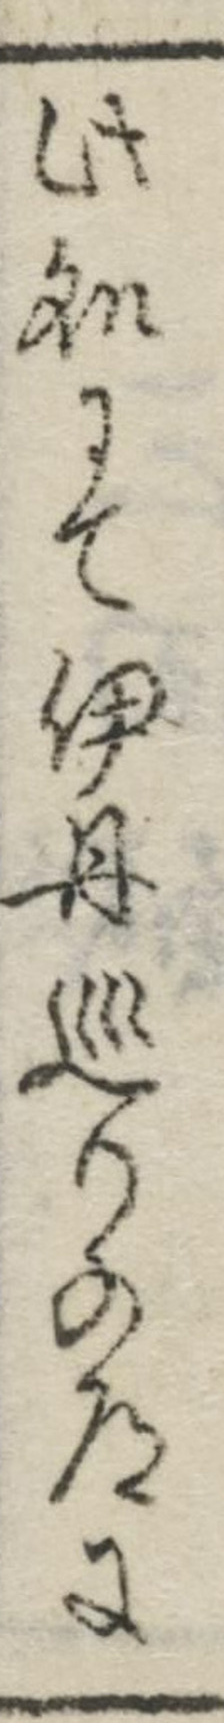此処にて伊丹巡りの道に
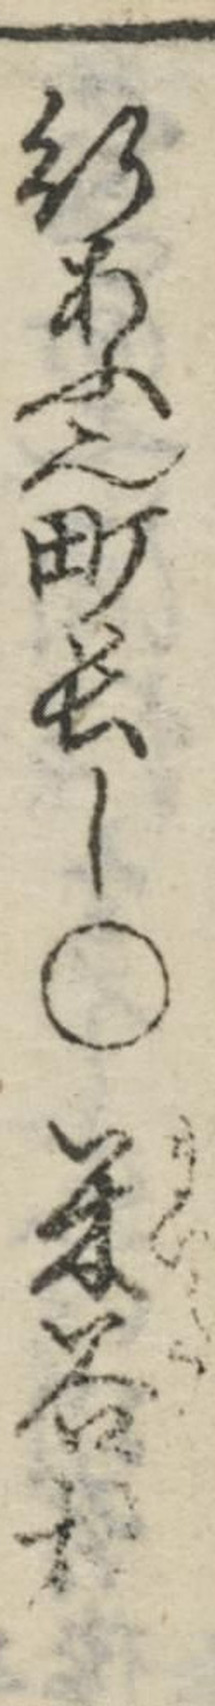行あふ也町長し○米谷村
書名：但州城崎浴湯辧
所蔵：東京大学地震研究所図書室 Earthquake Research Institute Library, The University of Tokyo, JAPAN
